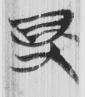𠭁
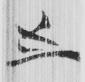之
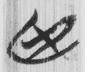臣
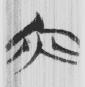亦
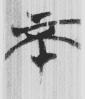不
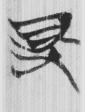𠭁
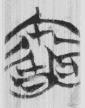{尒䎽}
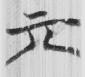亓
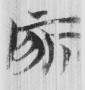所
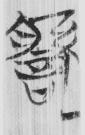䌛
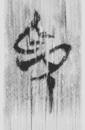卬
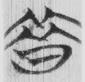昔
